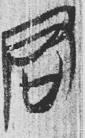君
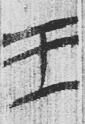王
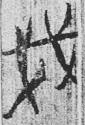戔
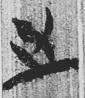之
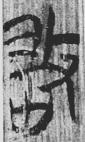敢
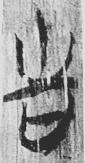告
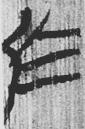於
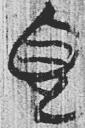見
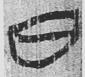日
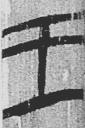王
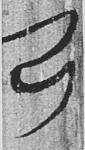乃
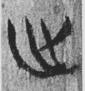出
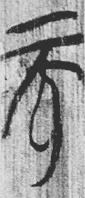而
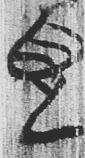見
